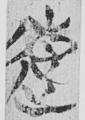○（傳）
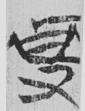史（史）
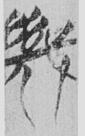幾（豈）
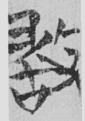敢
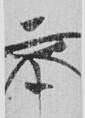不
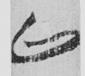㠯（以）
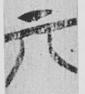亓（其）
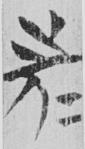先人
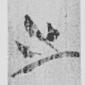之
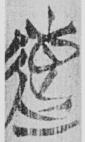○（傳）
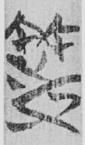等
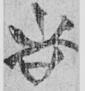告
